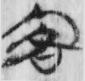客
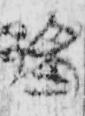○（威）
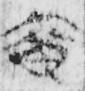○（奮）
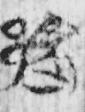○（魏）
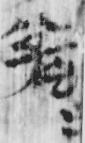公孫
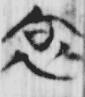哀
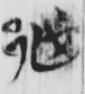○（越）
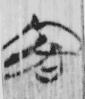客
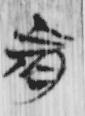前
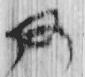尹
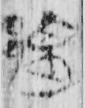○（威）
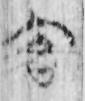客
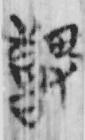鼙
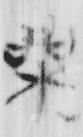喿
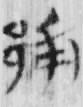郙
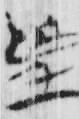○（望）
